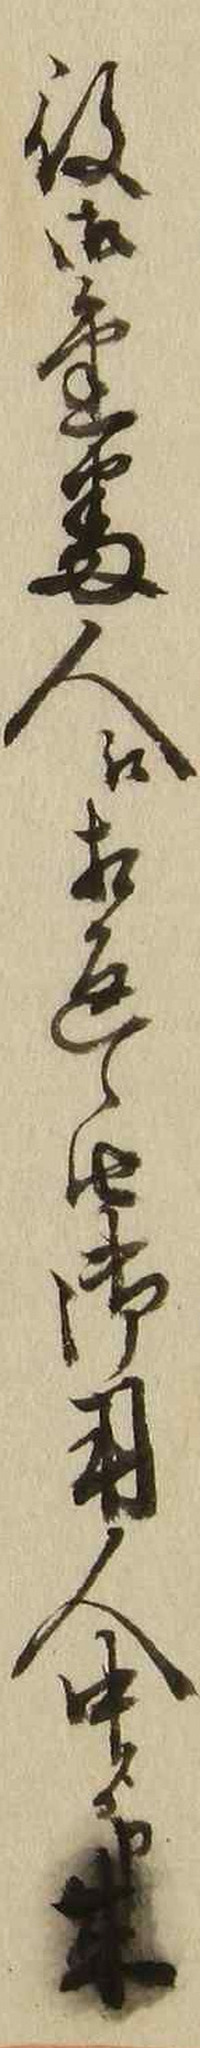役御金番人え相返候由御用人中ゟ申来
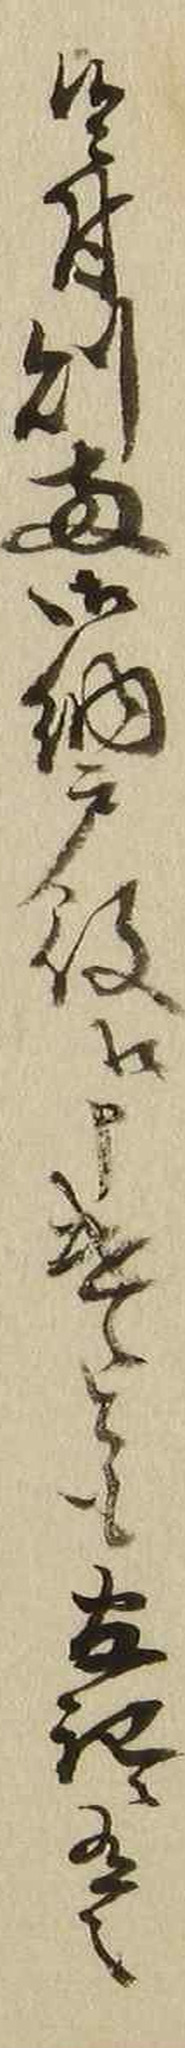候に付則両御納戸役え申遣候とも官記に有之
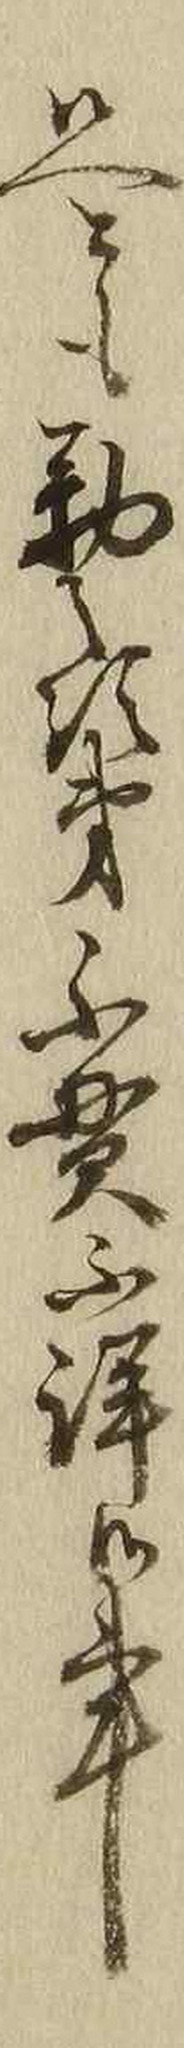候へとも勤之次第不貫不詳候事
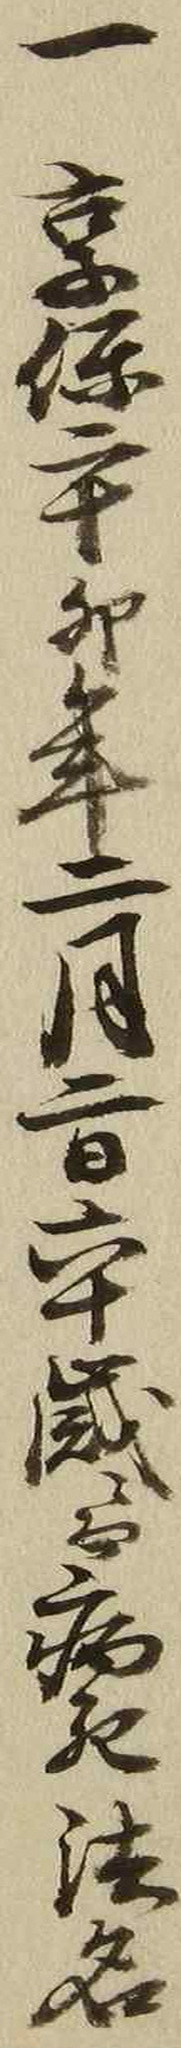一享保二十卯年二月二日六十歳に而病死法名
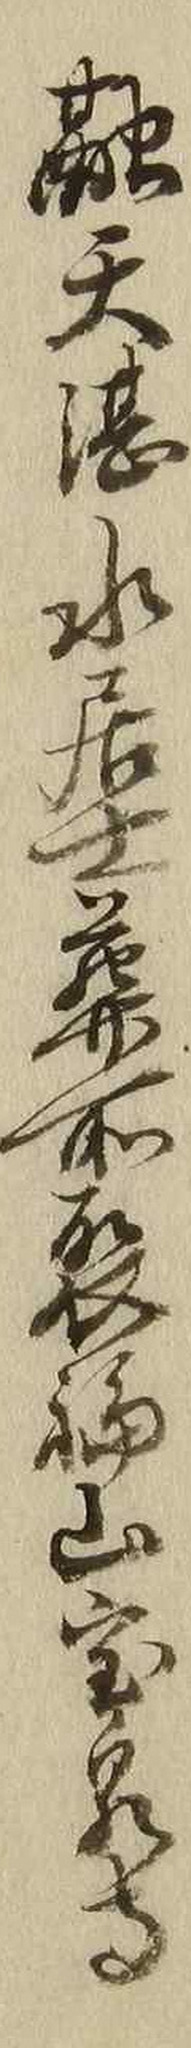融天湛水居士葬式所聚福山宝泉寺
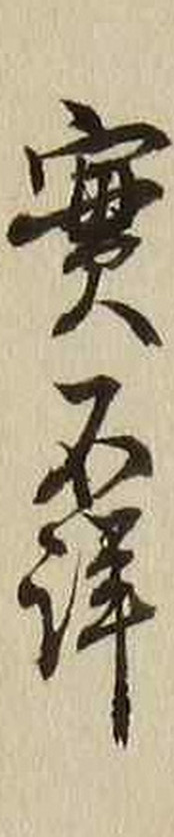実不詳
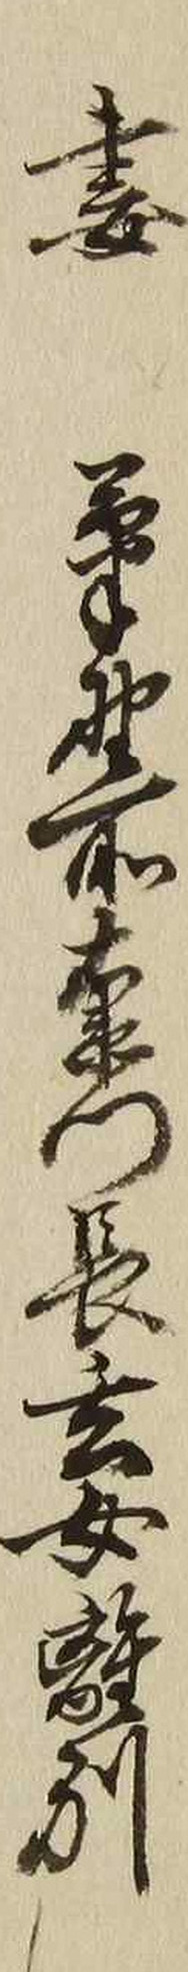妻菊野所右衛門長玄女離別
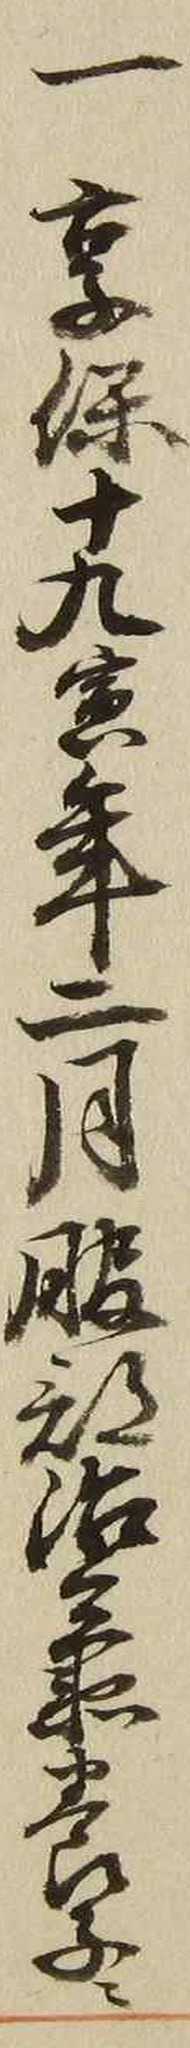一享保十九年寅年二月服部治兵衛養子に
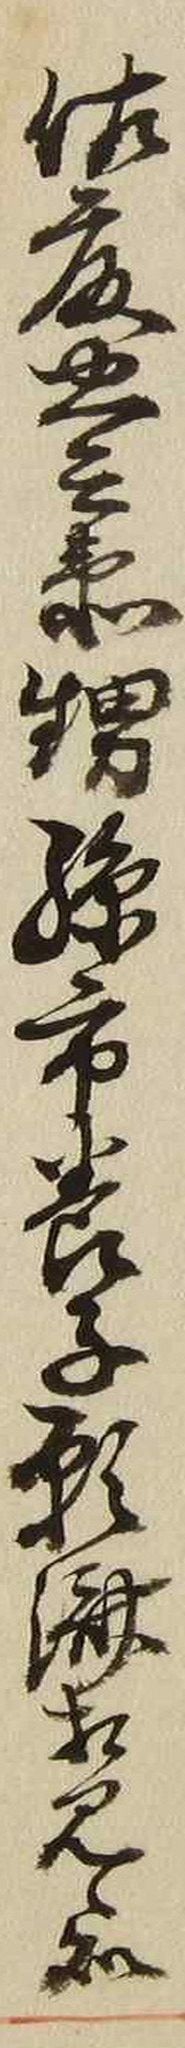佐藤忠兵衛甥孫市養子願済相見候処
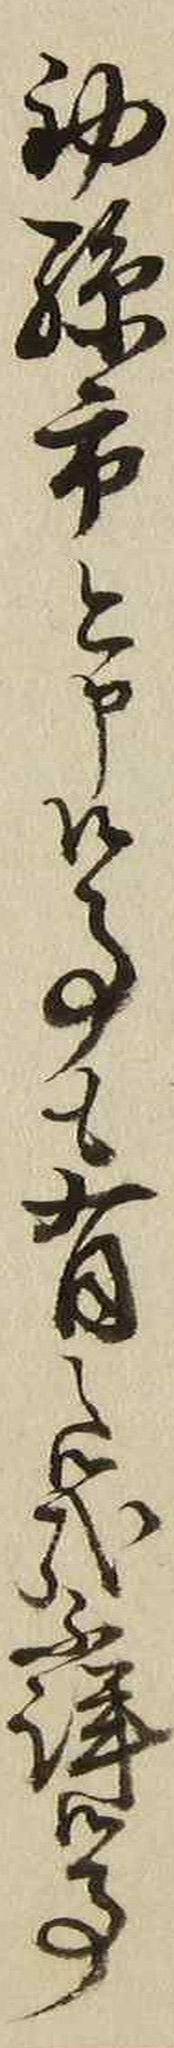初孫市と申候事も有之候哉不詳候事
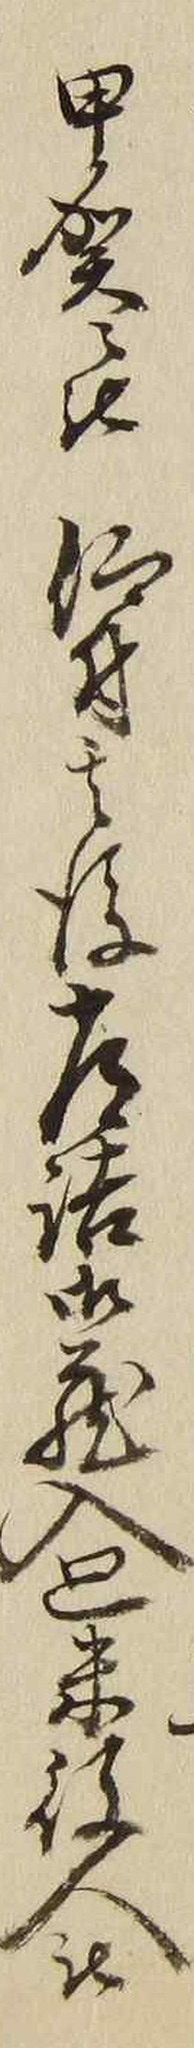甲賀に被仰付其後常詰御蔵入廻米役人被
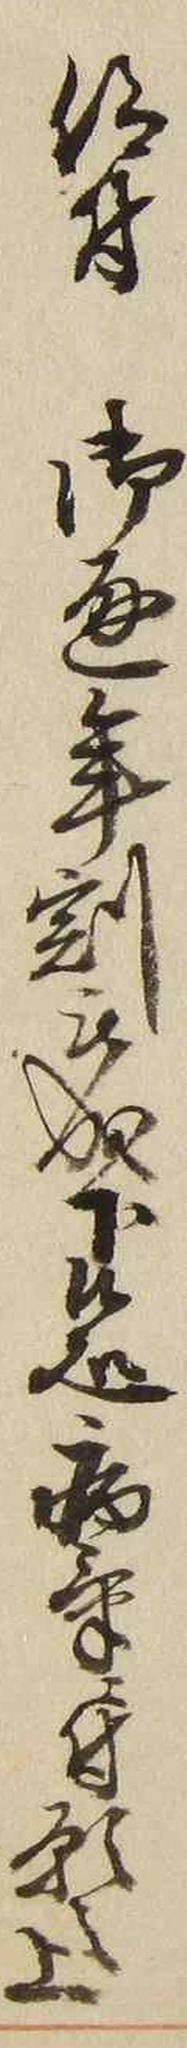仰付御通年割被成下候処病気に付願之上

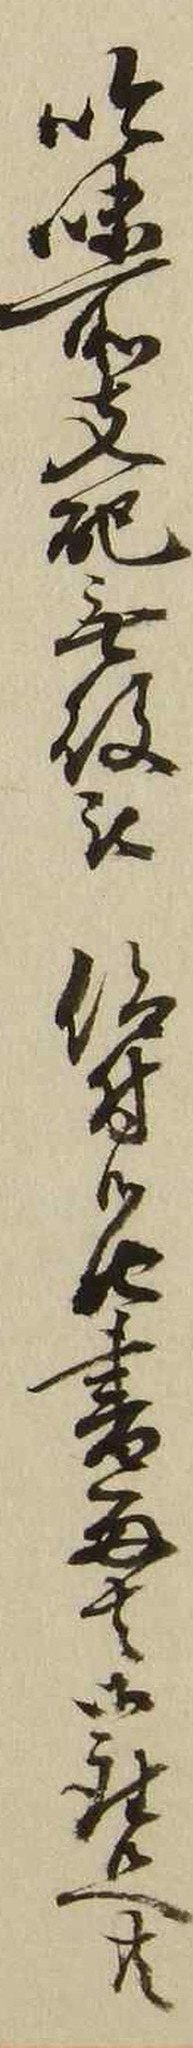吟味所支配無役被仰付候由書留は御座候へ共
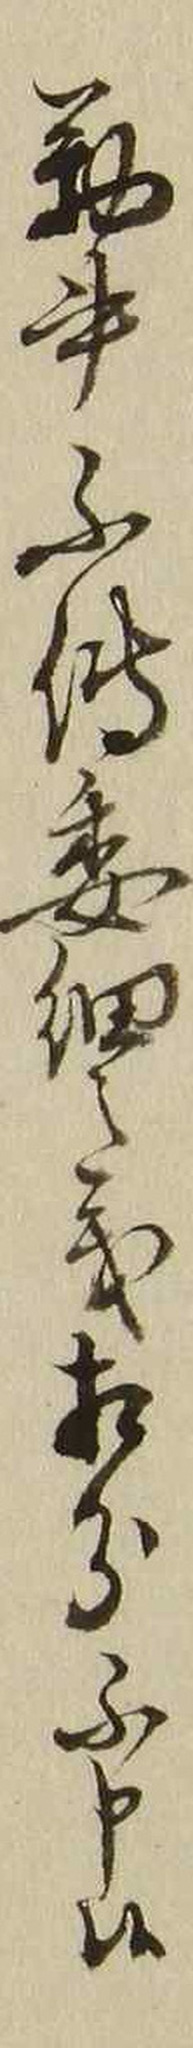勤事不伝委細之義相分不申候
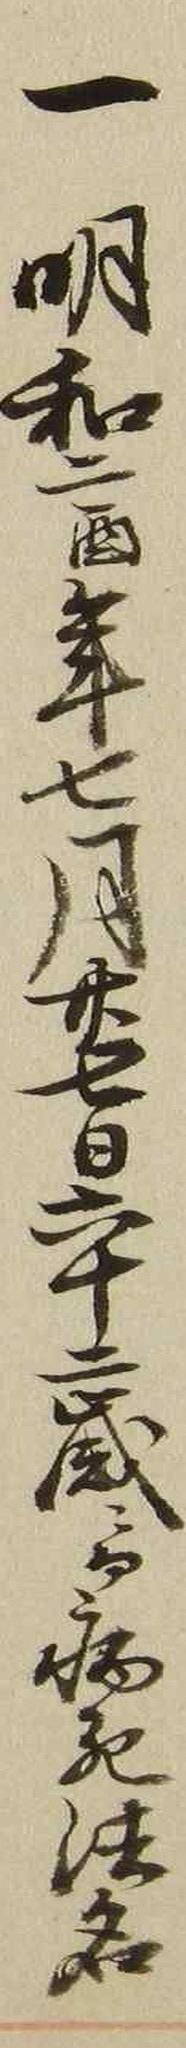一明和二酉年七月廿七日六十二歳に而病死法名
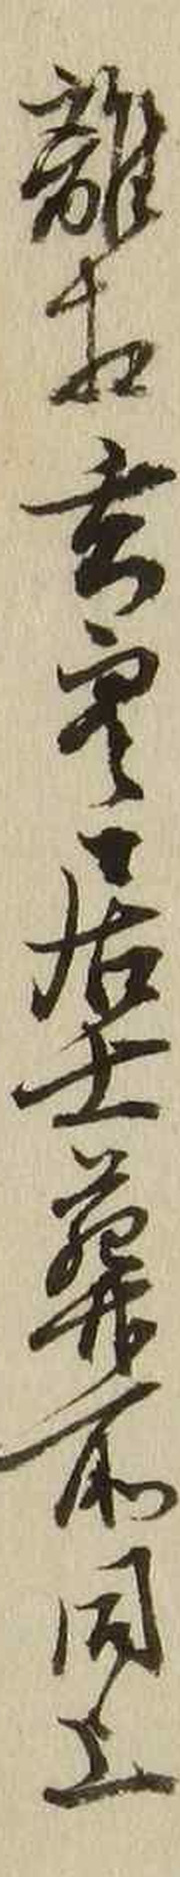離相玄空居士葬所同上
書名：諸士系譜　巻之38　は之部6
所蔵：会津若松市立会津図書館
